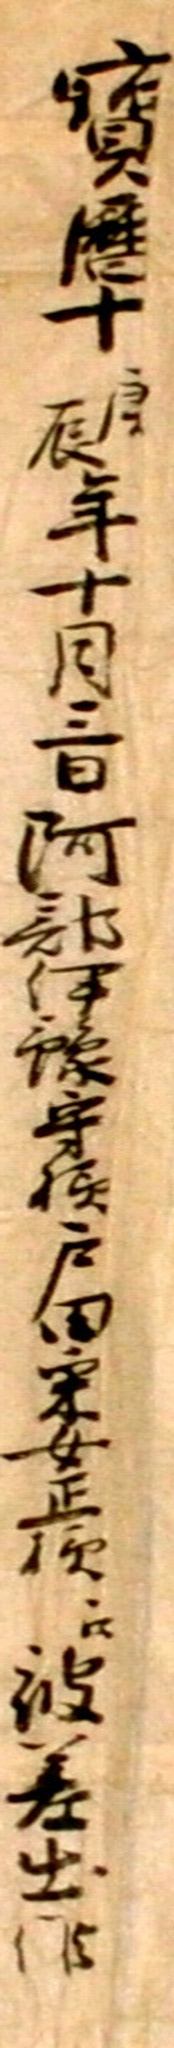宝暦十庚辰年十月三日阿部伊予守様戸田采女正様江被差出候
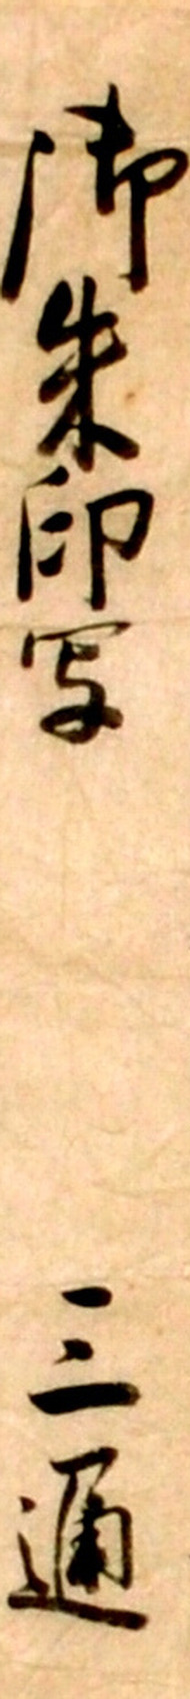御朱印写三通
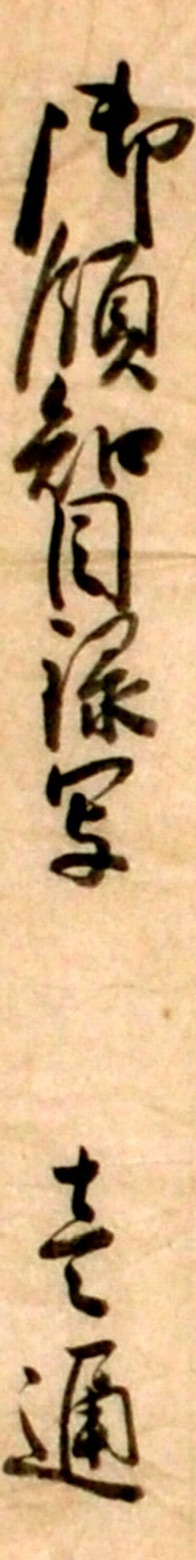御領知目録写壱通
